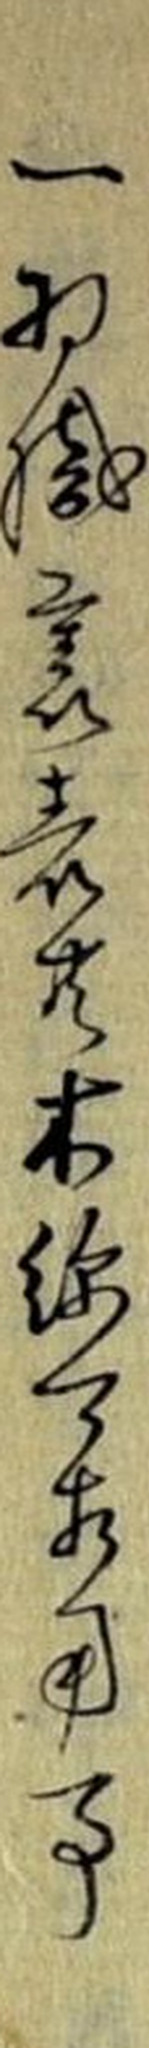一羽織裏表共木綿可相用事
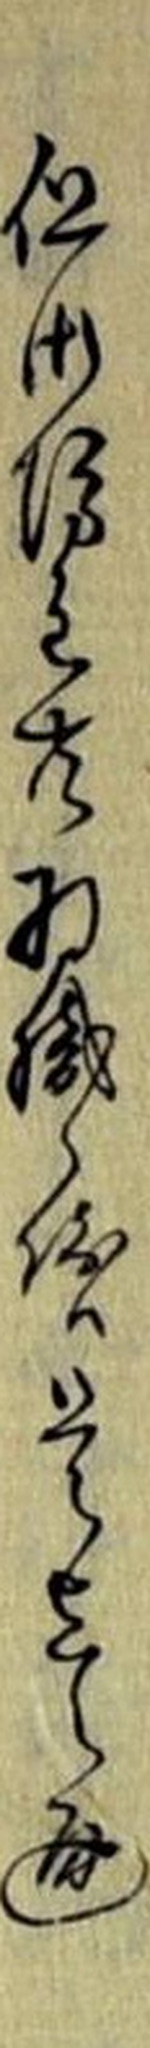但御坊主共羽織之儀ハ是迄之通
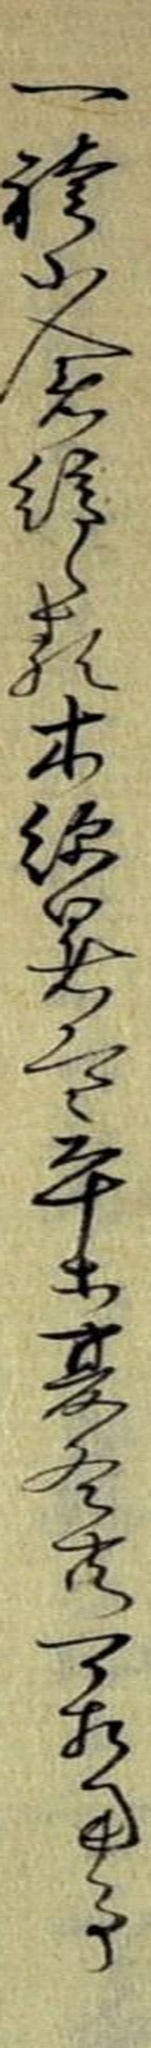一袴小倉縞之類木綿暑寒平等夏冬共可相用事
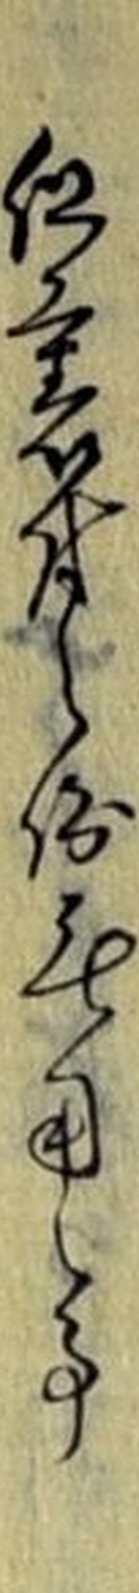但裏付之儀無用之事
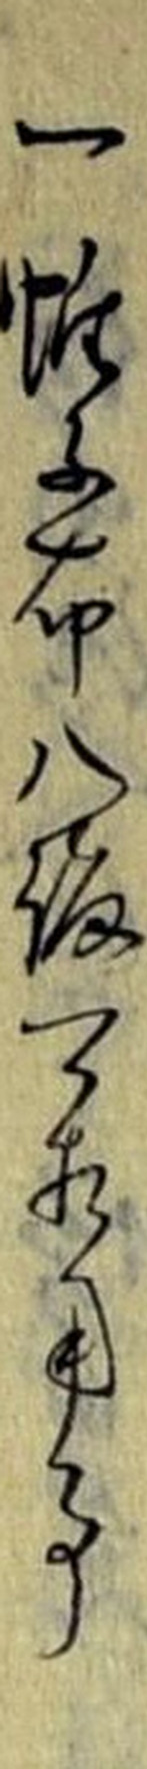一帷子布八講可相用事
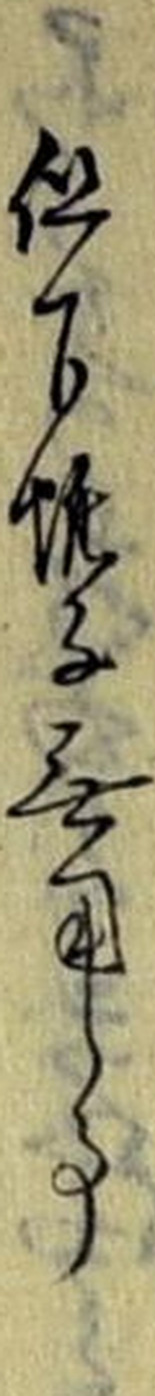但下帷子無用之事
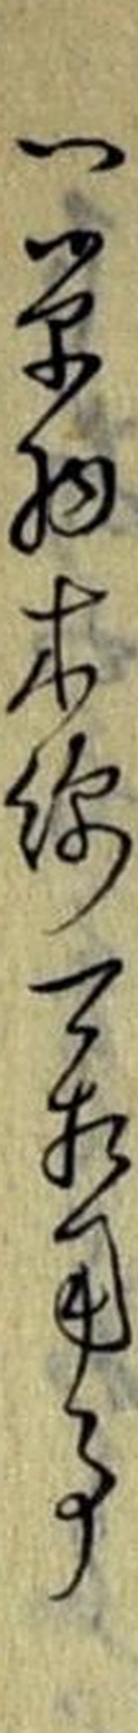一単物木綿可相用事
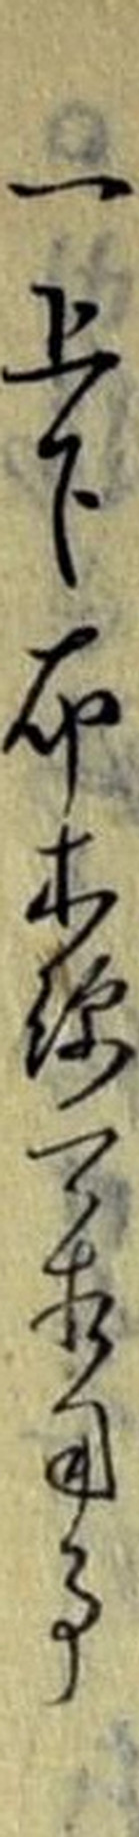一上下布木綿可相用事
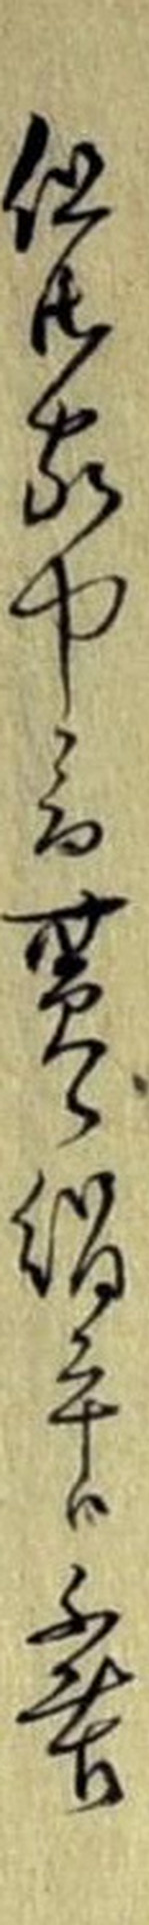但御家中ニ而貰候絹平ハ不苦
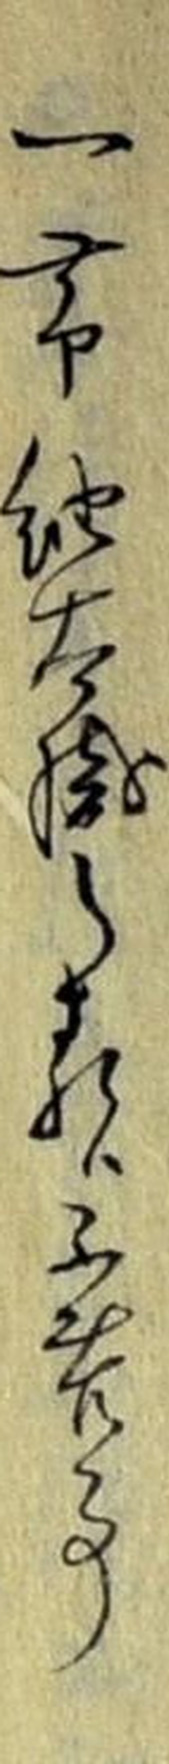一帯紬太織之類ハ不苦事
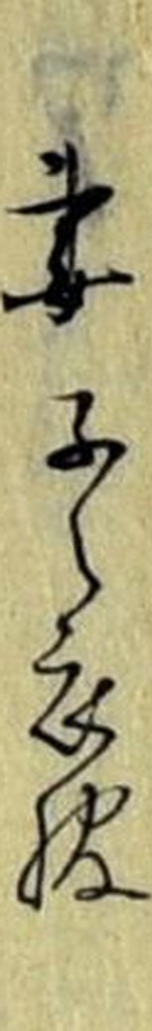妻子の衣服
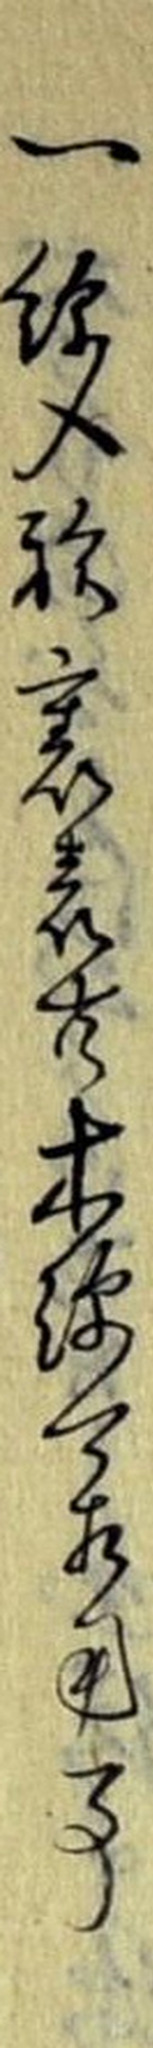一綿入袷裏表共木綿可相用事
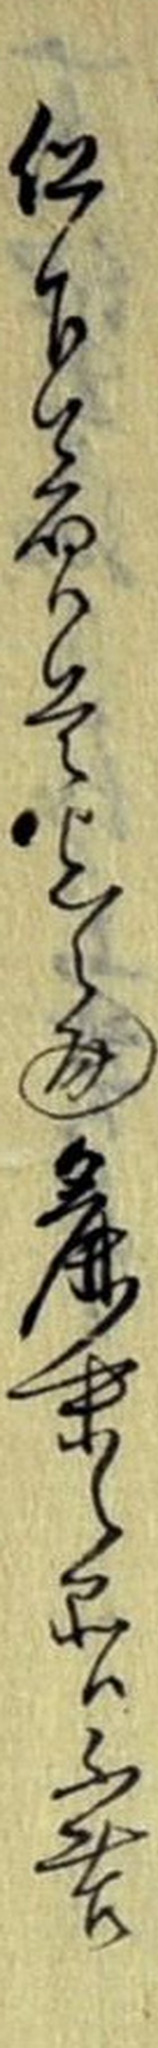但下着ハ是迄之通麁末之品ハ不苦
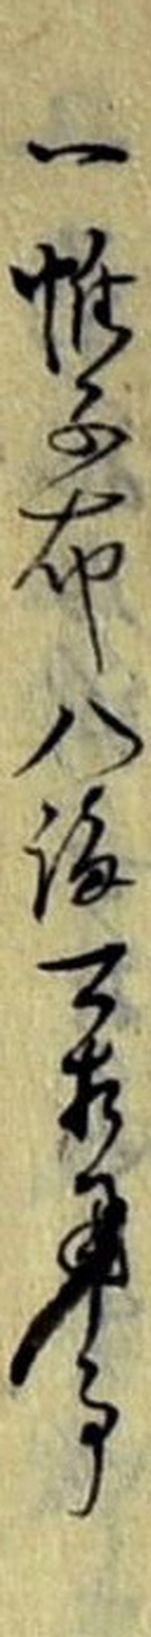一帷子布八講可相用事

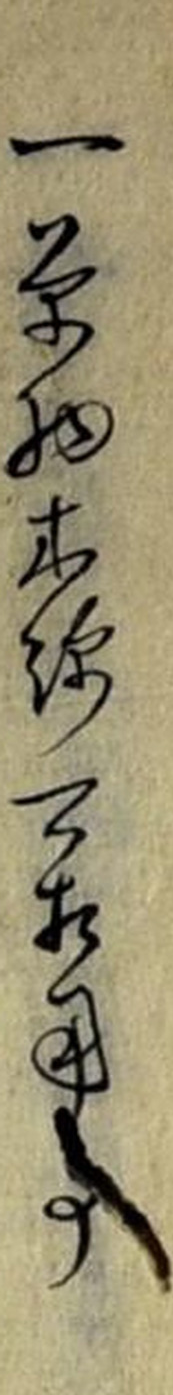一単物木綿可相用事
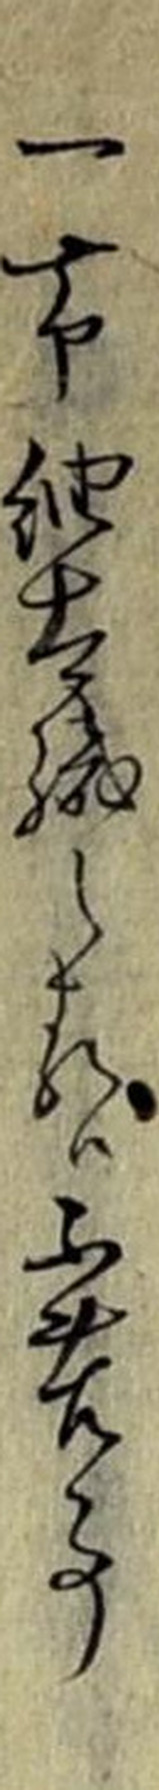一帯紬太織之類ハ不苦事
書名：命令之部 五
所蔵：福井県文書館 Fukui Prefectural Archives
